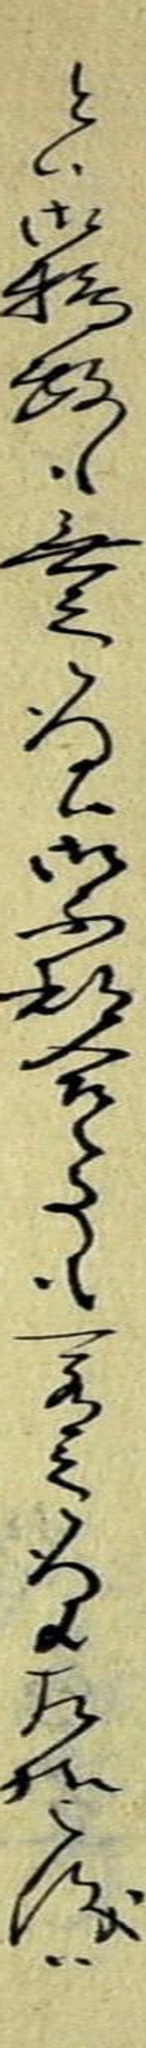とは御鵜数も無之候得は御不都合之事も可有之候得共左様之儀は
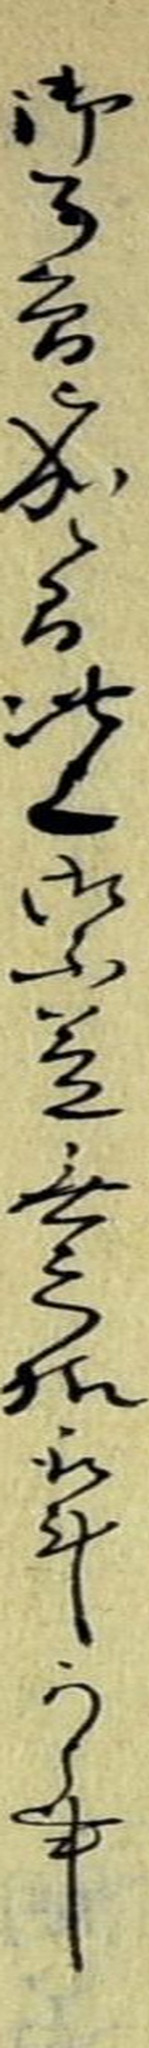御了簡被成候間此上御不益無之様取斗可申事
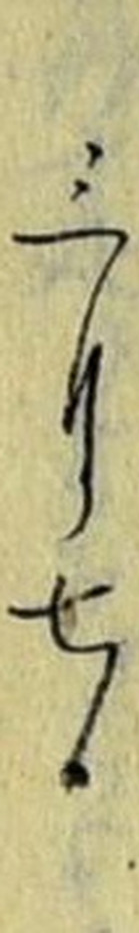三月七日
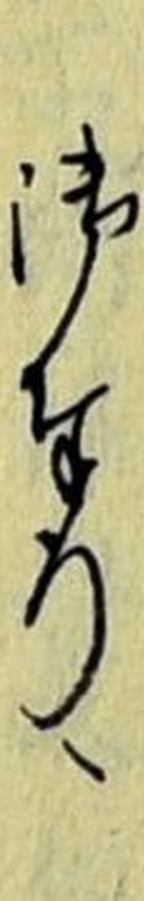御奉行へ
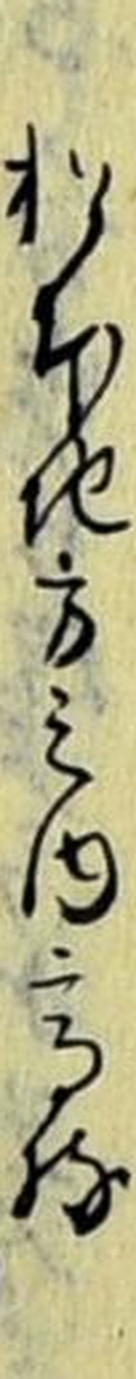松本地方之内高持
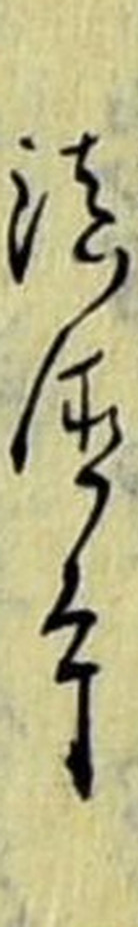鎮徳寺

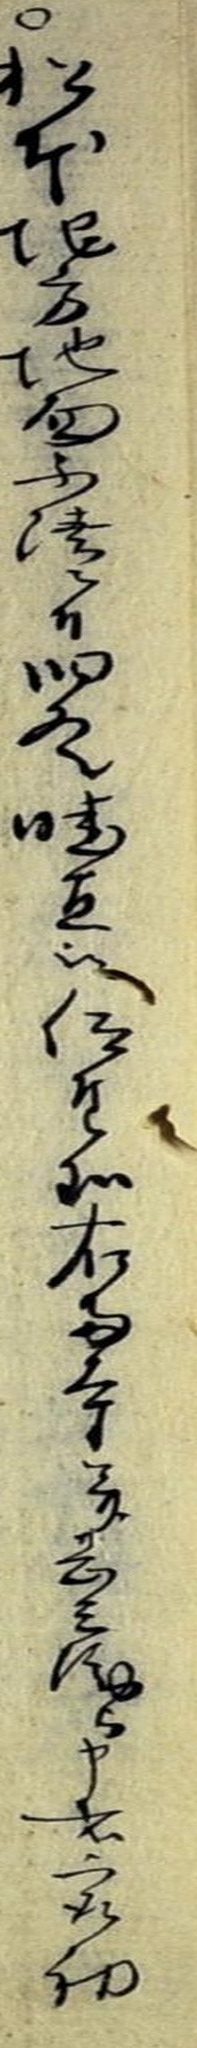○松本地方地面不陸に付旧冬畦直被仰付候処右両寺并甚兵衛と申者最初
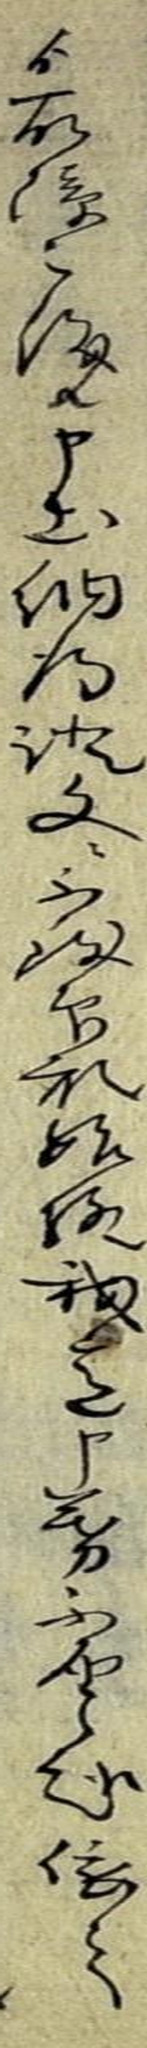ゟ故障之儀共申出納得証文に不致印形始終我意申募不届之趣依之
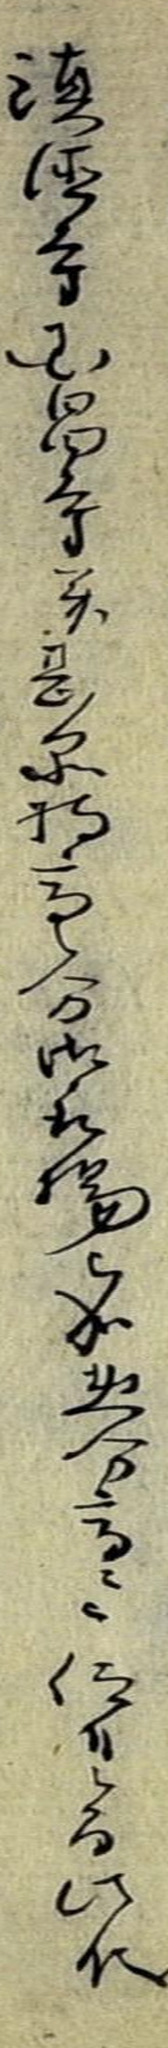鎮徳寺国昌寺并甚兵衛持高之分御取揚被成惣分高に被仰付候間此段
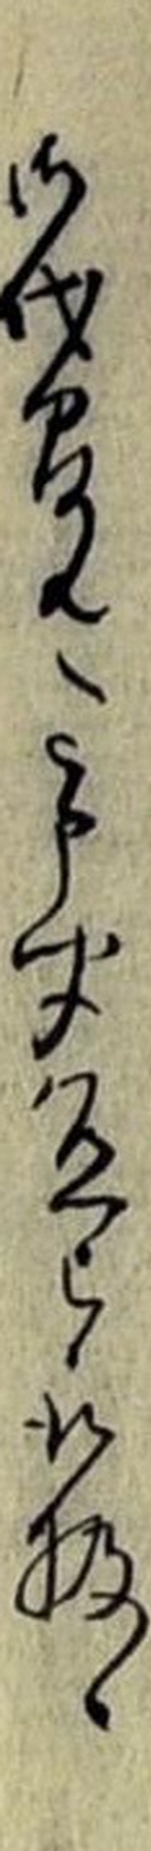御代官共へ被申聞置被取扱候
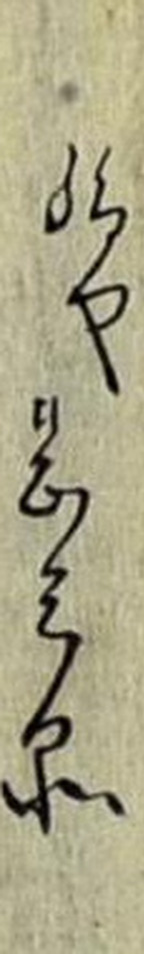鈴や甚兵衛
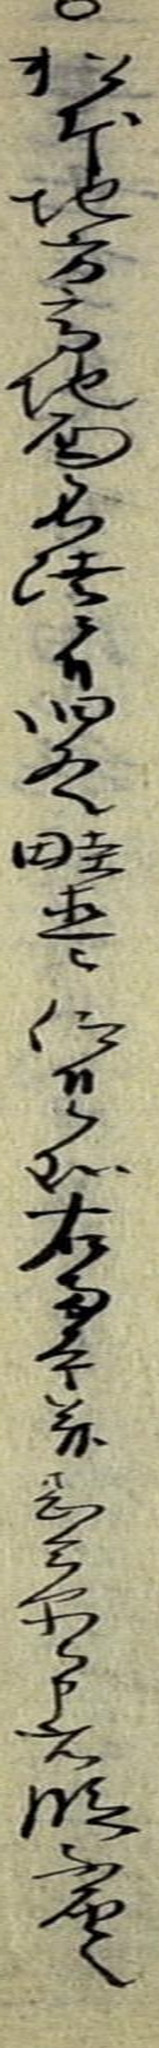○松本地方高地面不陸に付旧冬畦直被仰付候処右両寺并甚兵衛と申者段不届之
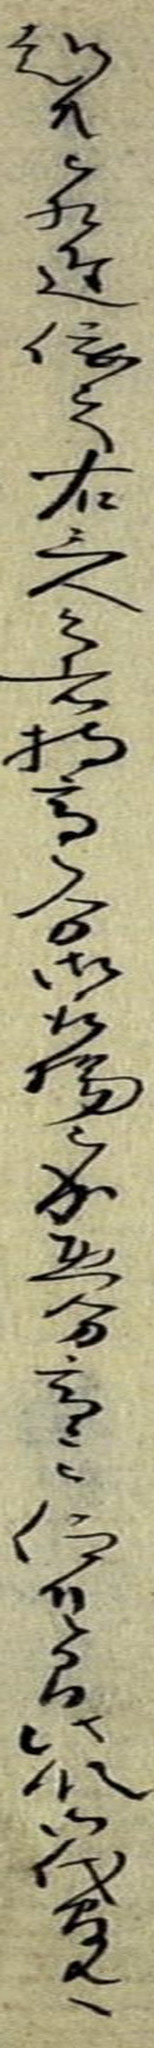趣共被相達依之右三人之者持高之分御取揚被成惣分高に被仰付候間此段御代官共へ
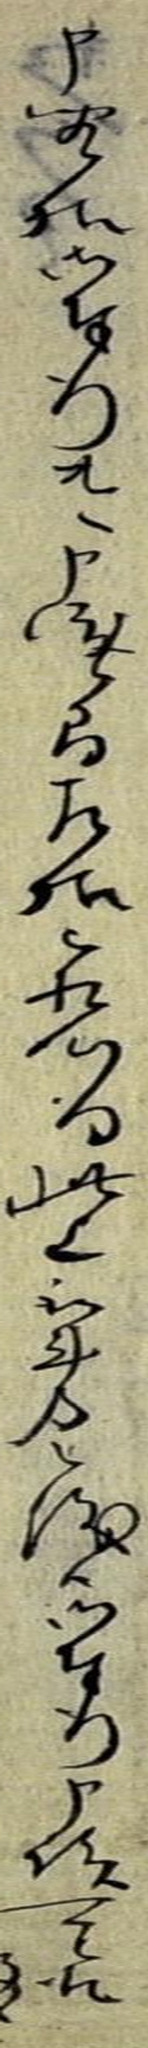申聞候様御奉行共へ申渡候間左様被相心得此上取斗方之儀は御奉行申談可被取扱候
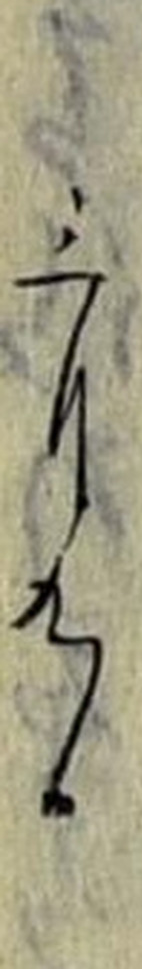三月九日
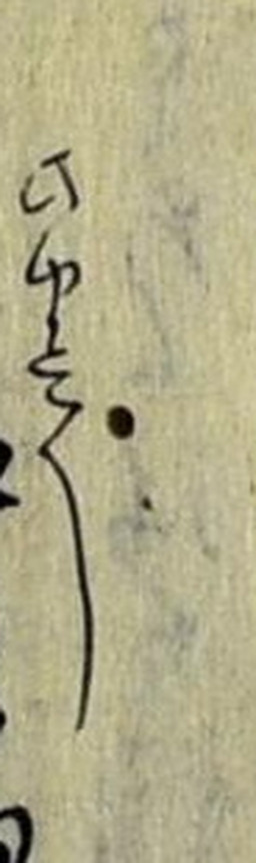此内壱人
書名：命令之部 四
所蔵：福井県文書館 Fukui Prefectural Archives
